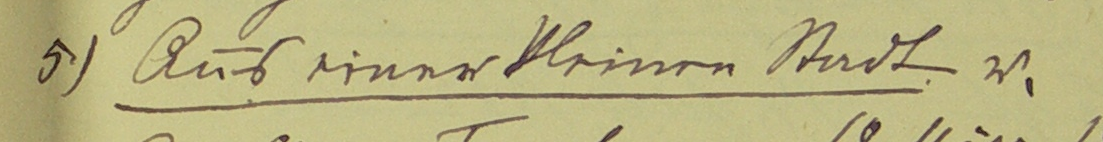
5.) Aus einer kleinen Stadt von
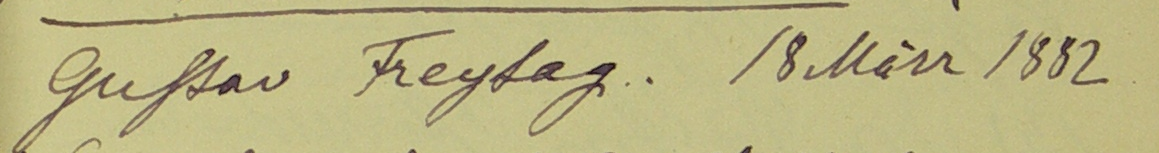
Gustav Freytag am 18. März 1882
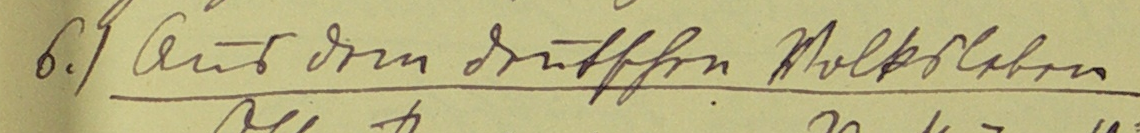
6.) Aus dem deutschen Volksleben
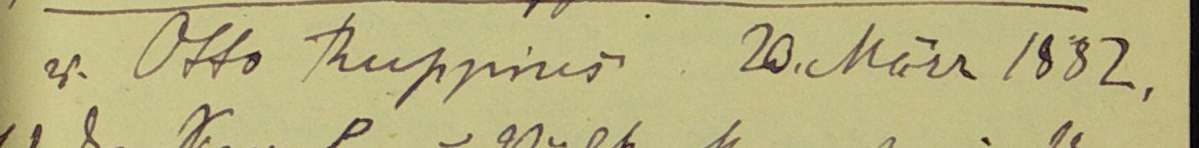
von Otto Ruppius am 20 März 1882
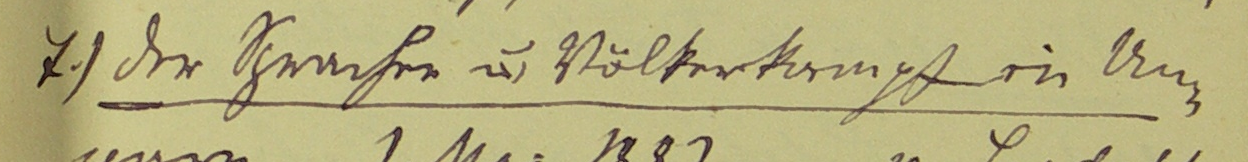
7.) Die Sprachen und Völkerkampf in Un¬
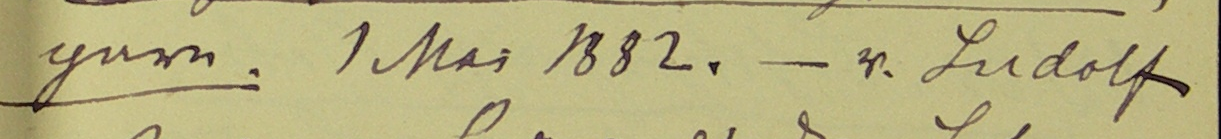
garn von Ludolf am 1 Mai 1882
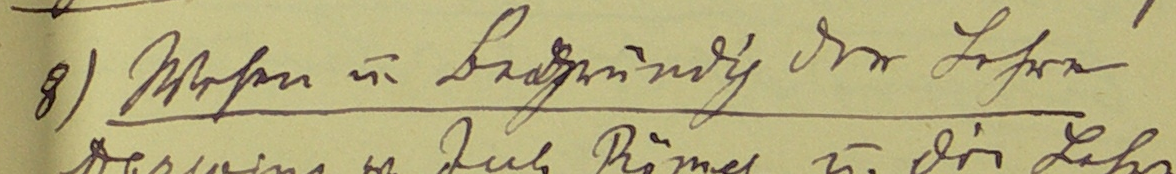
8.) Wesen u. Begründung der Lehre
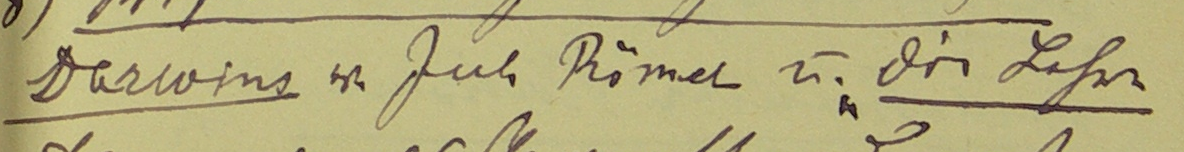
Darwins von Jul. Römer und die Lehre
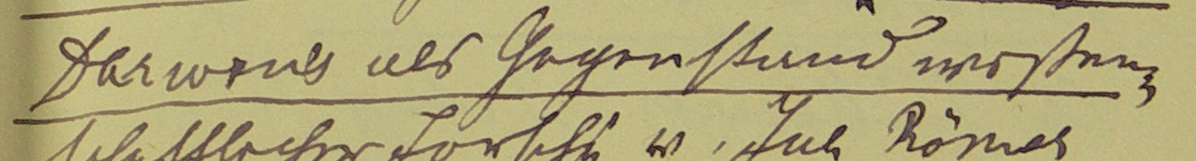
Darwins als Gegenstand wissen¬
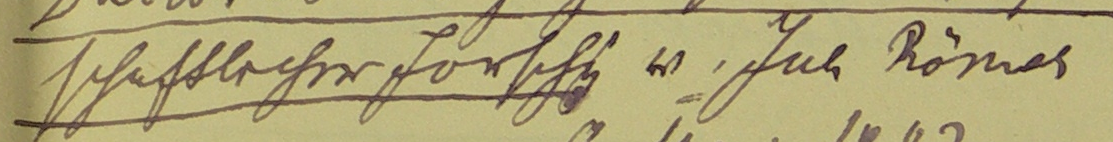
schaftlicher Forschung v. Jul Römer
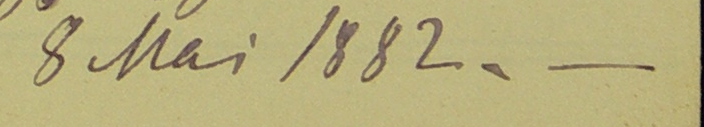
8 Mai 1882
